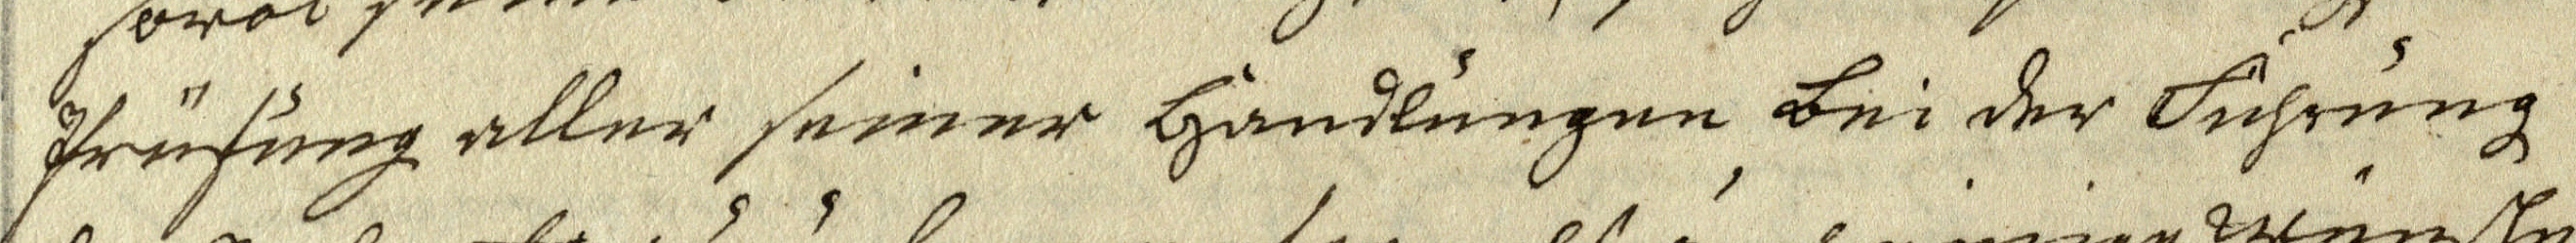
Prüfung aller seiner Handlungen bei der Führung
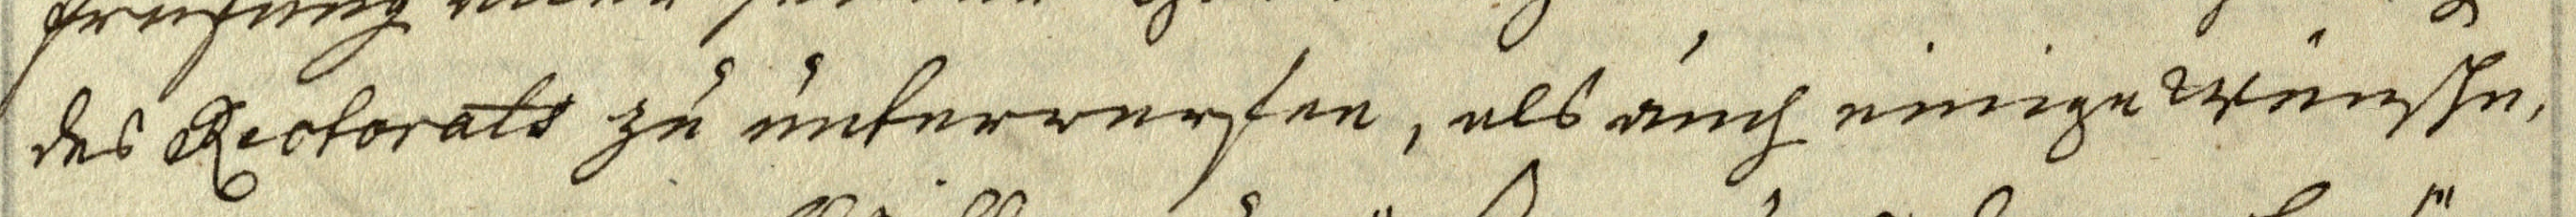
des Rectorats zu unterwerfen, als auch einige Wünsche,
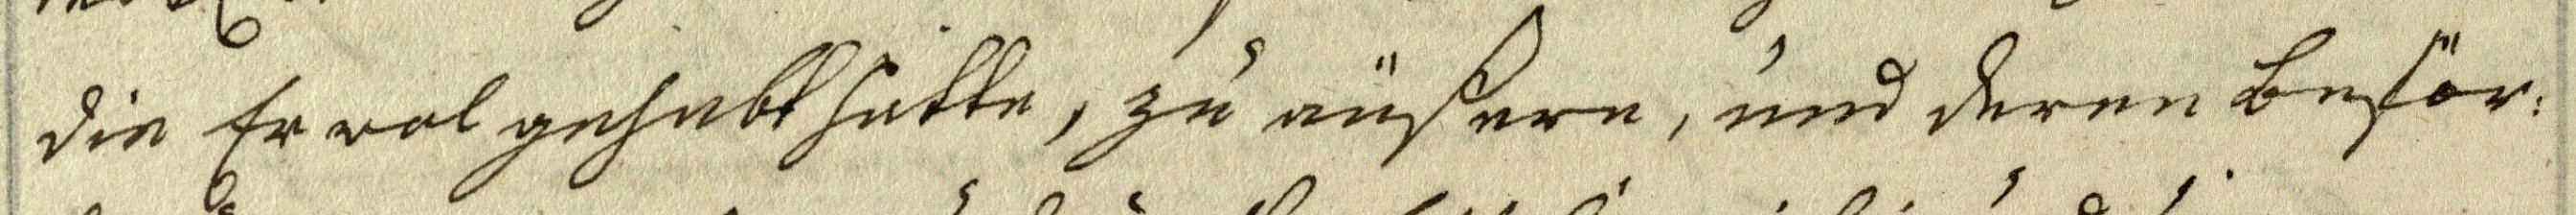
die Er wol gehabt hätte, zu äußern, und deren Beför¬
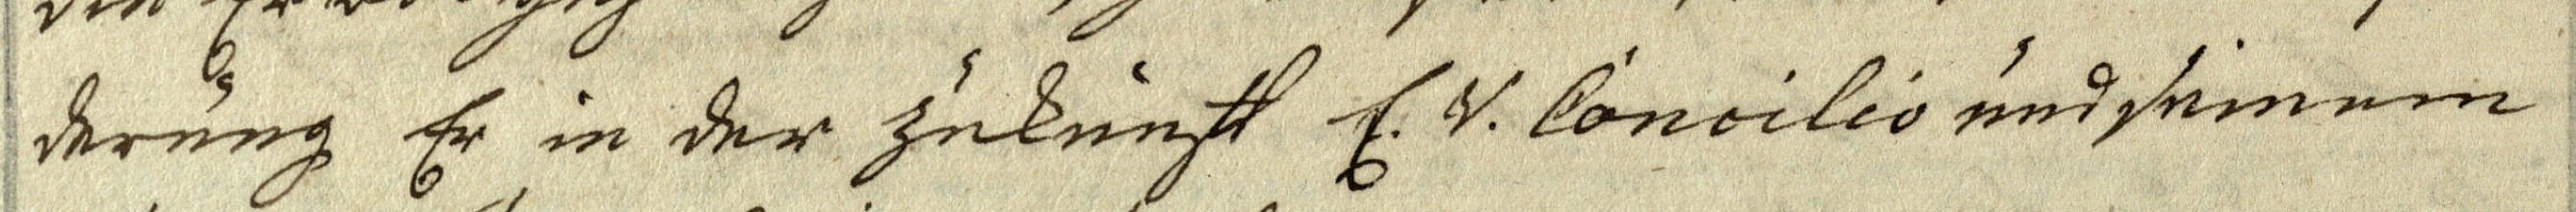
derung Er in der Zukunft E. V. Concilio und seinem
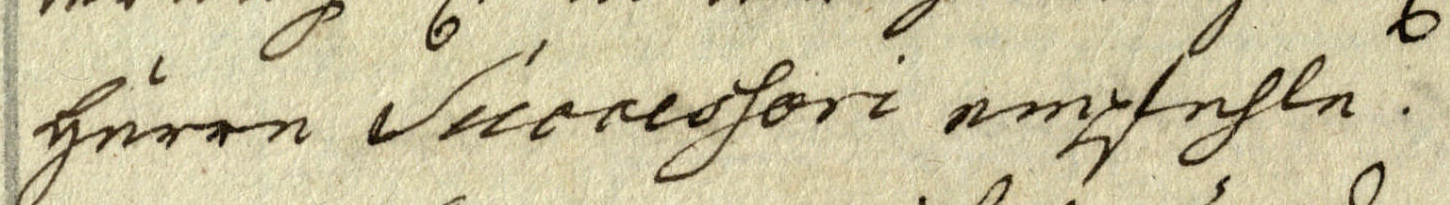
Herrn Successori empfehle.
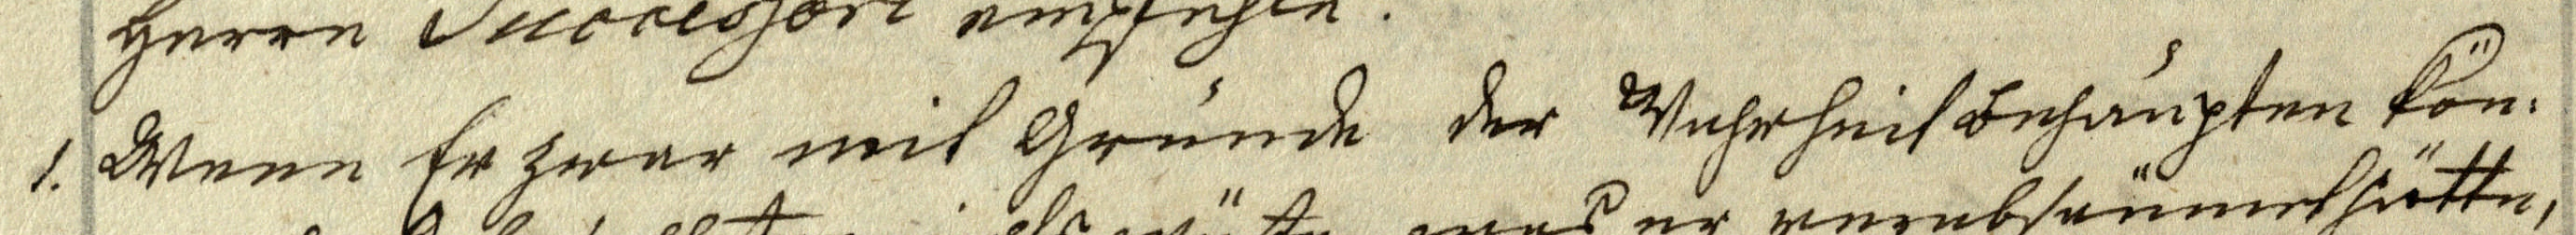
1. Wenn Er zwar mit Gründe der Wahrheit behaupten kön¬
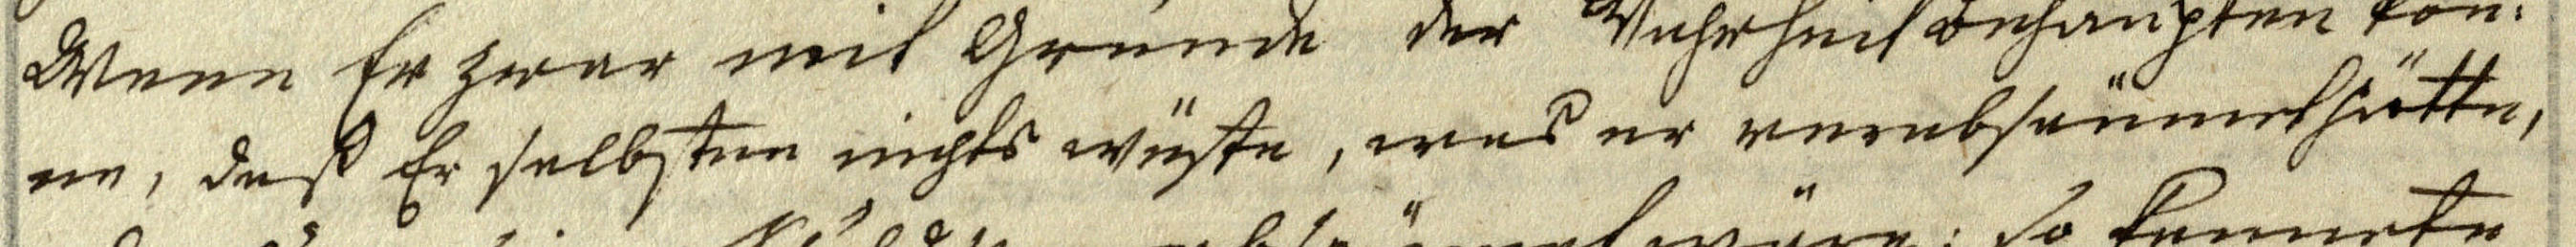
ne, daß Er selbsten nichts wüste, was er verabsäumet hätte,
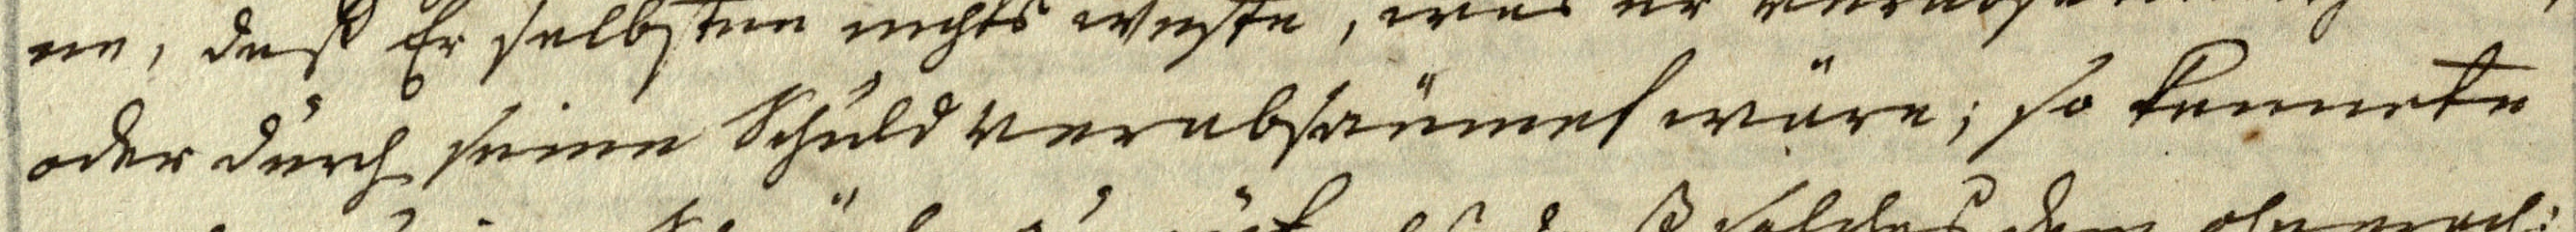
oder durch seine Schuld verabsäumet wäre; so kennete
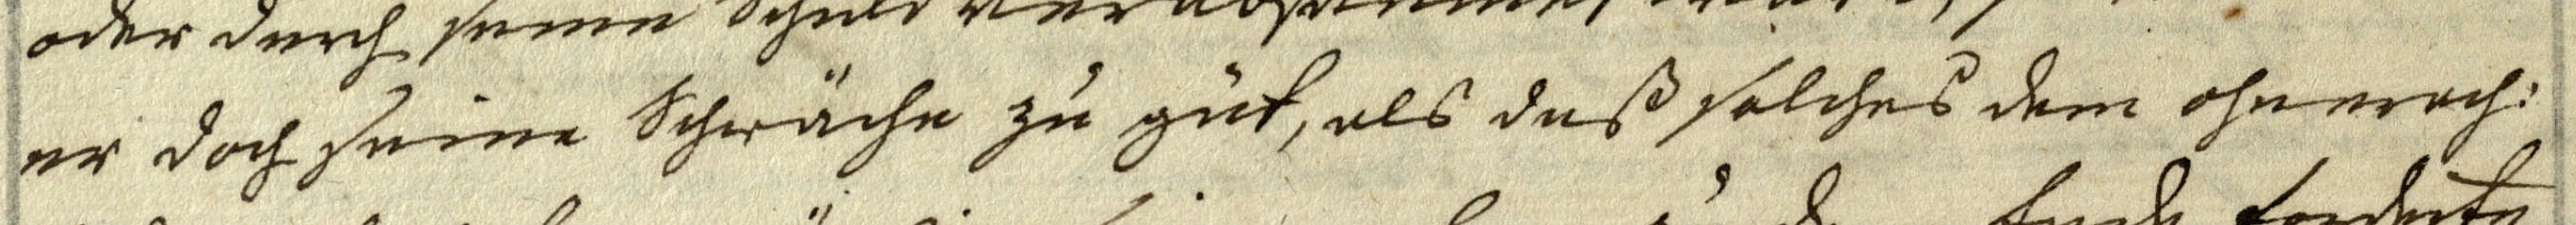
er doch seine Schwäche zu gut, als daß solches dem ohnerach¬
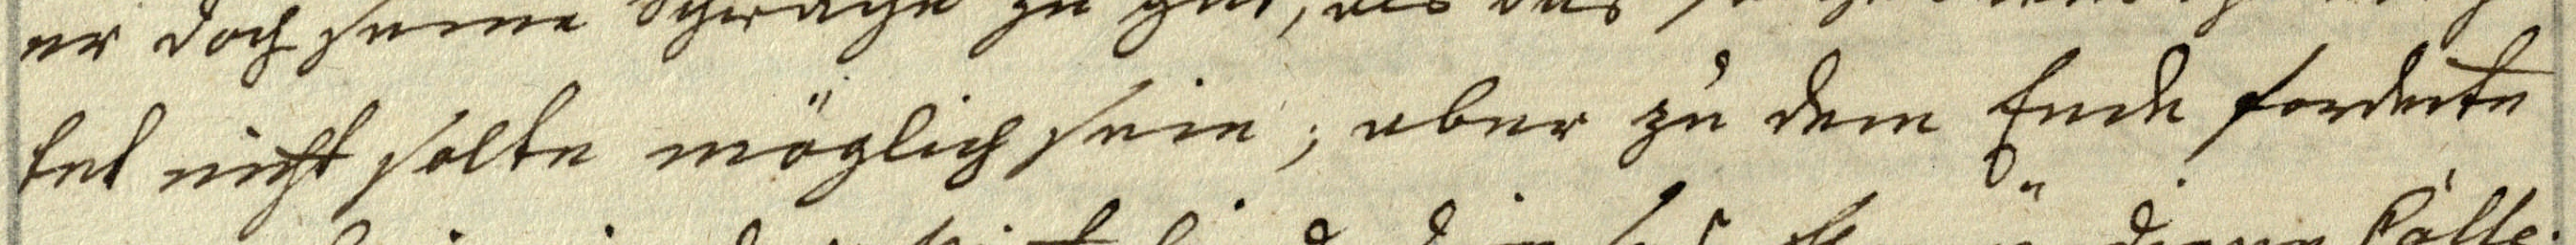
tet nicht solte möglich sein, aber zu dem Ende forderte
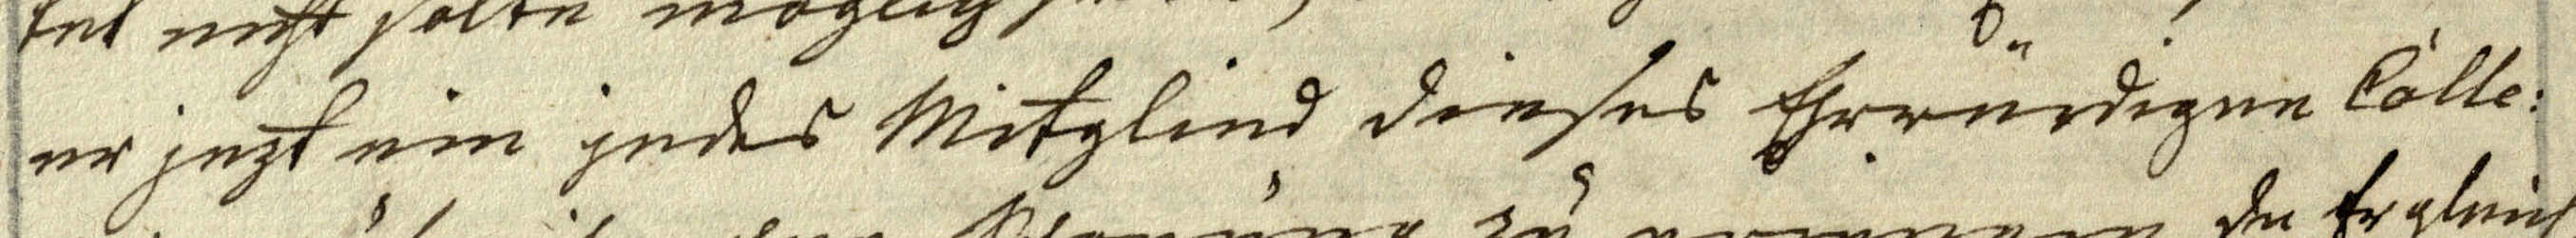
er jezt ein jedes Mitglied dieses Ehrwürdigen Colle¬
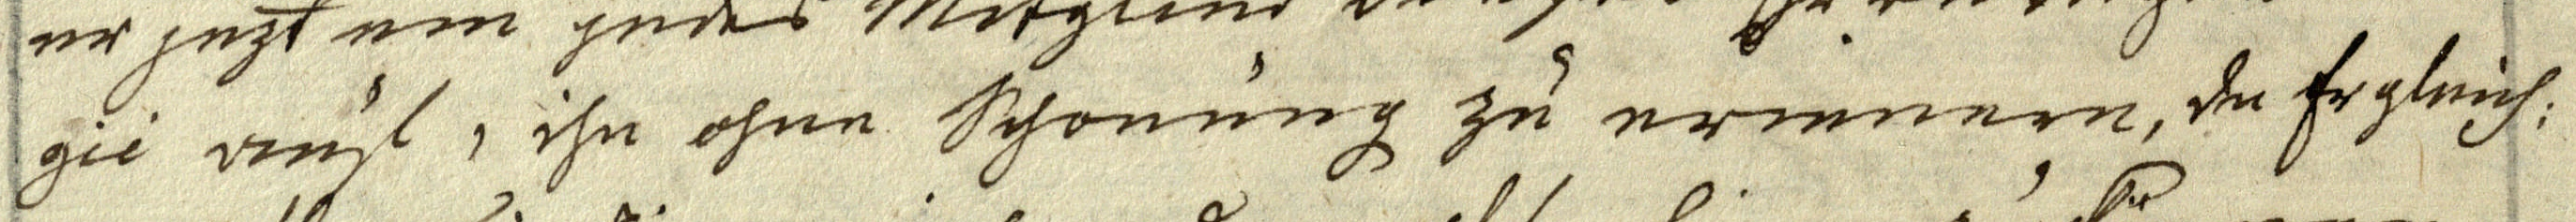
gii auf, ihn ohne Schonung zu erinnern, da Er gleich¬
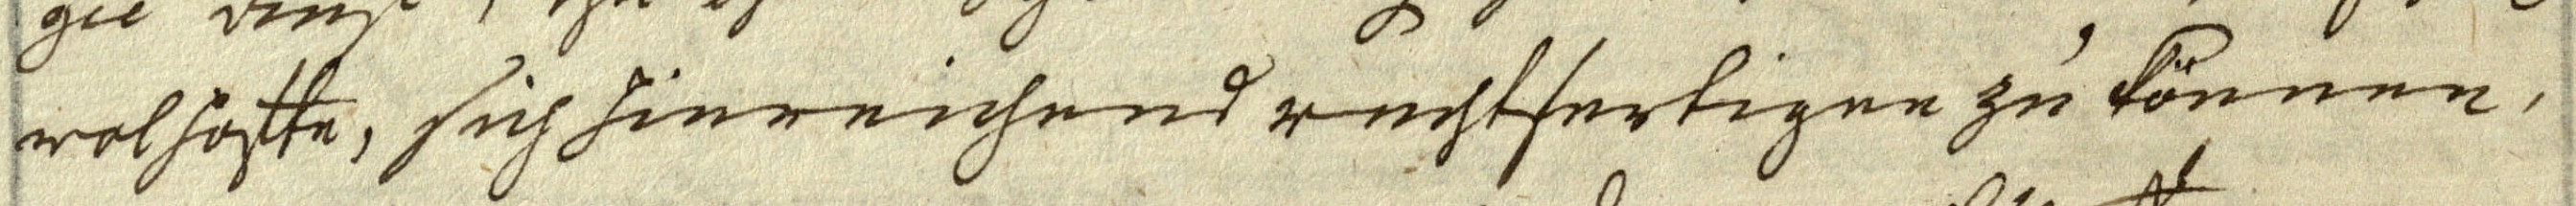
wol hoffte, sich hinreichend rechtfertigen zu können,
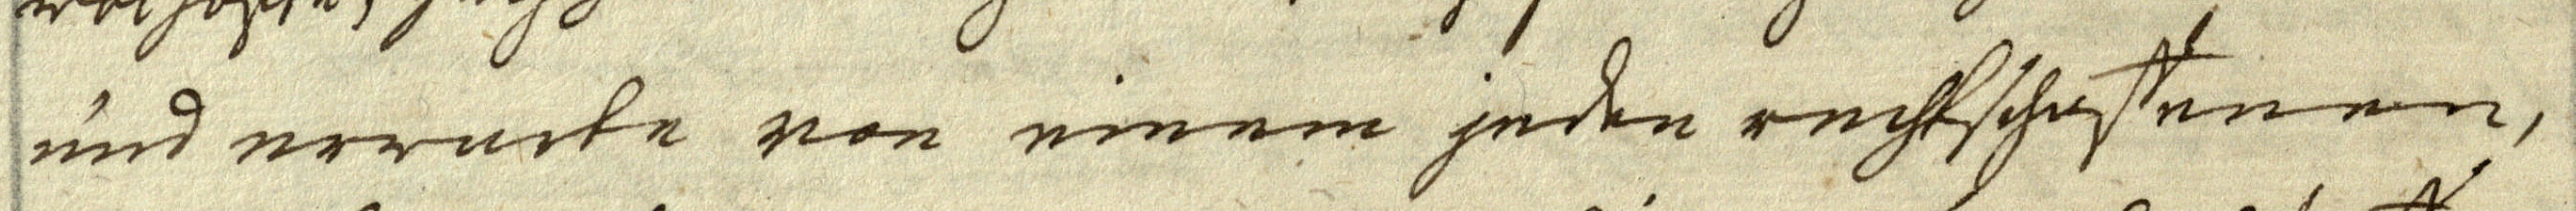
und erwartevon einem jeden rechtschaffenen,
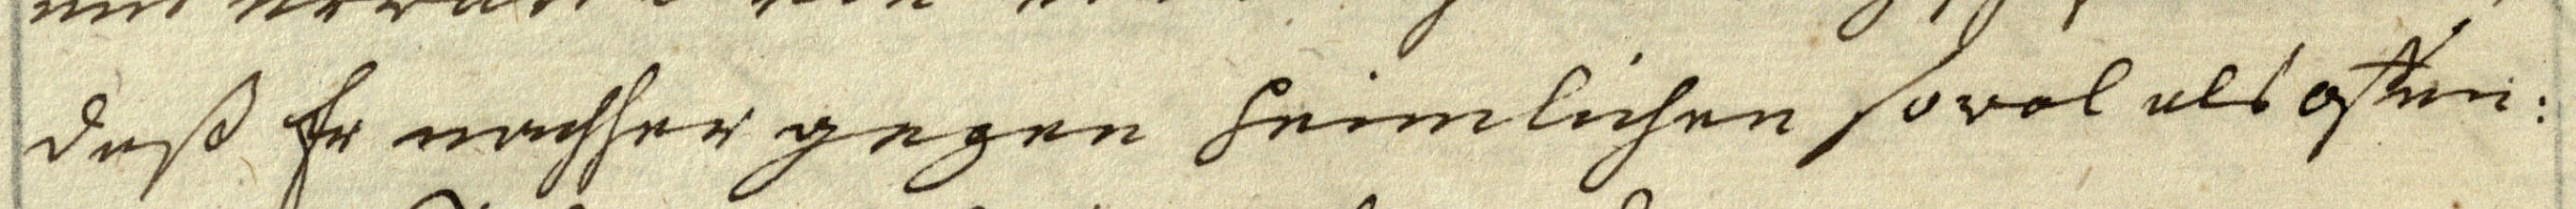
daß Er nachher gegen heimlichen sowol als offen¬
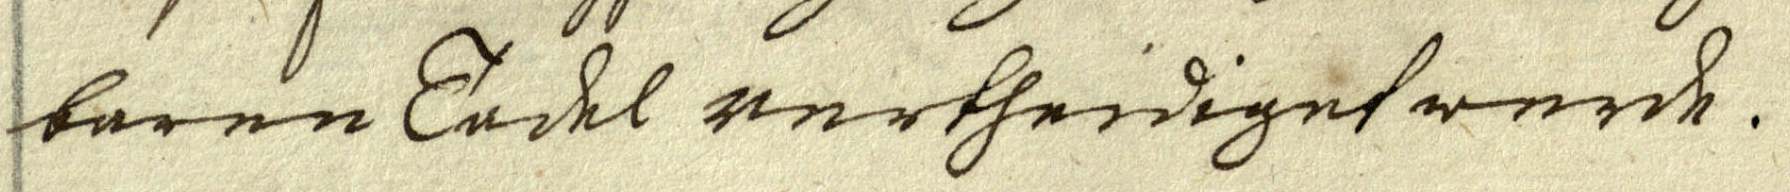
baren Tadel vertheidiget werde.
